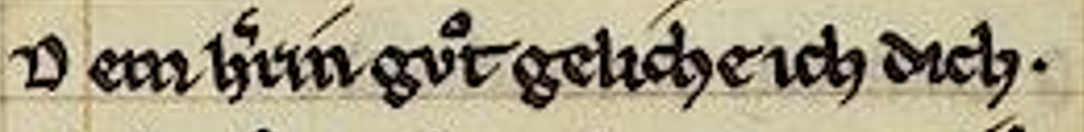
Dem h(er)rin gv°ot geliche ich dich.
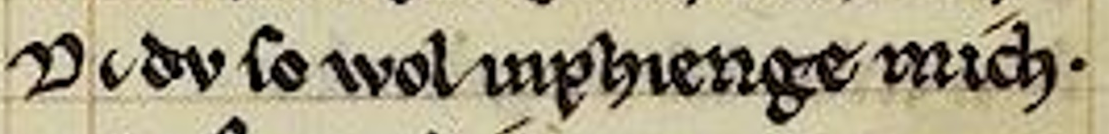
D(az) dv ſo wol inphienge mich.
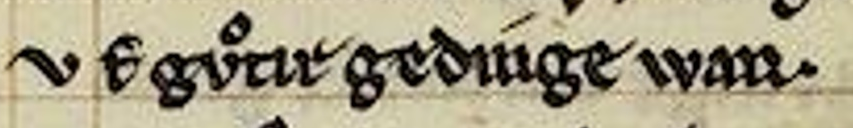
Vf gv°otir gedinge wan.
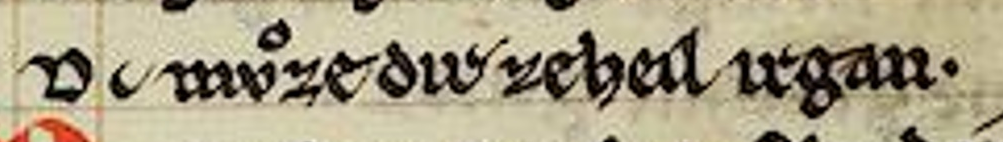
D(az) mv°oze dir zeheil irgan.
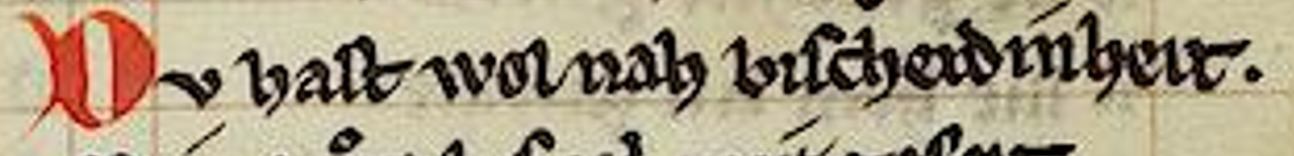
*Dv haſt wol nah biſcheidinheit.
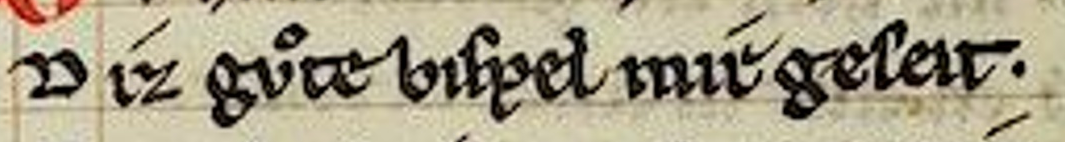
Diz gv°ote biſpel mir geſeit.
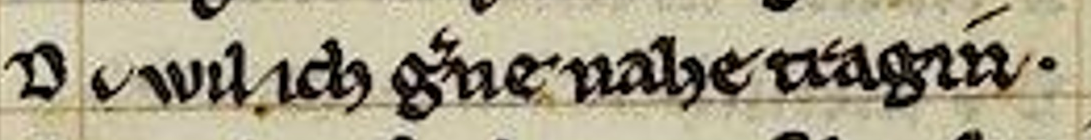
D(az) wil ich g(er)ne nahe tragin.
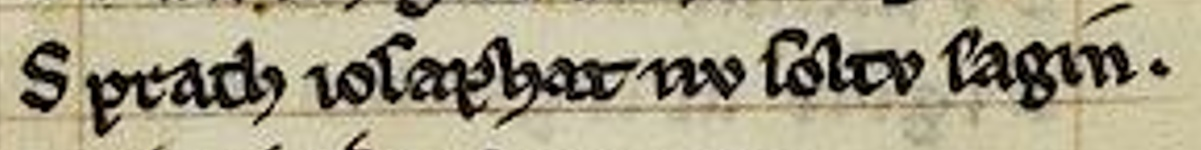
Sprach ioſaphat nv ſoltv ſagin.
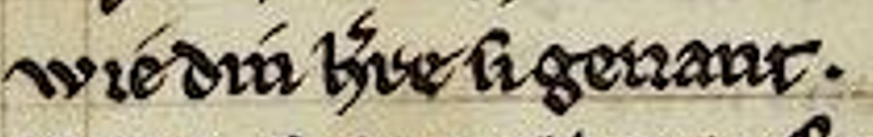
Wie din h(er)re ſi genant.
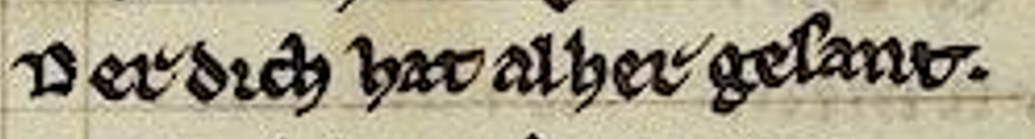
D(er) dich hat alher geſant.
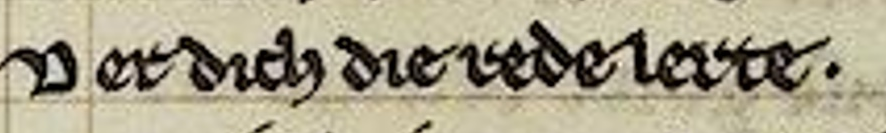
Der dich die rede lerte.
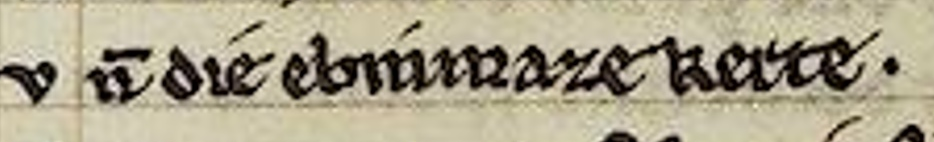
Vn(d) die ebinmaze kerte.
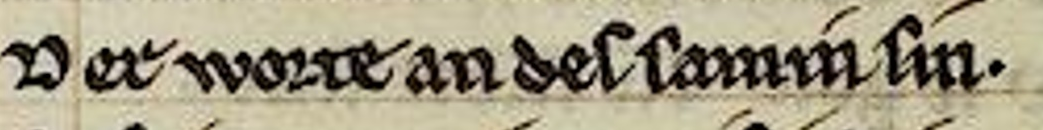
Der worte an deſ ſamin ſin.
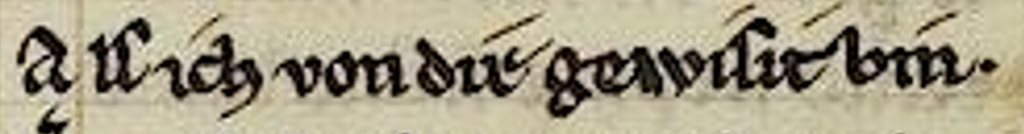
Alſ ich von dir gewiſit bin.
